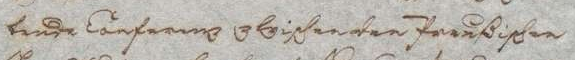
tende Conferenz zwischen den Preußischen
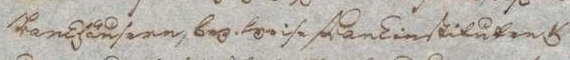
Bankhäusern, bez.weise Bankinstituten &
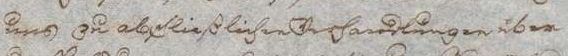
uns zu abschließlichen Verhandlungen über
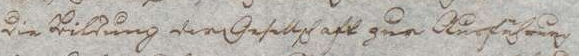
die Bildung der Gesellschaft zur Ausführung
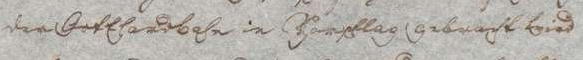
der Gotthardbahn in Vorschlag gebracht wird.
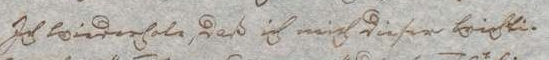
Ich wiederhole, daß ich mich dieser wichti-
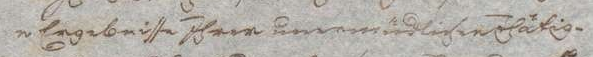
gen Ergebnisse Ihrer unermüdlichen Thätig-
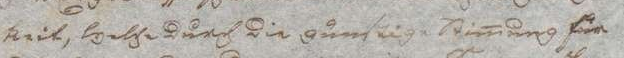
keit, welche durch die günstige Stimmung für
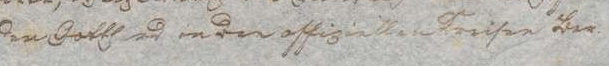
den Gotthard in den offiziellen Kreisen Ber-
